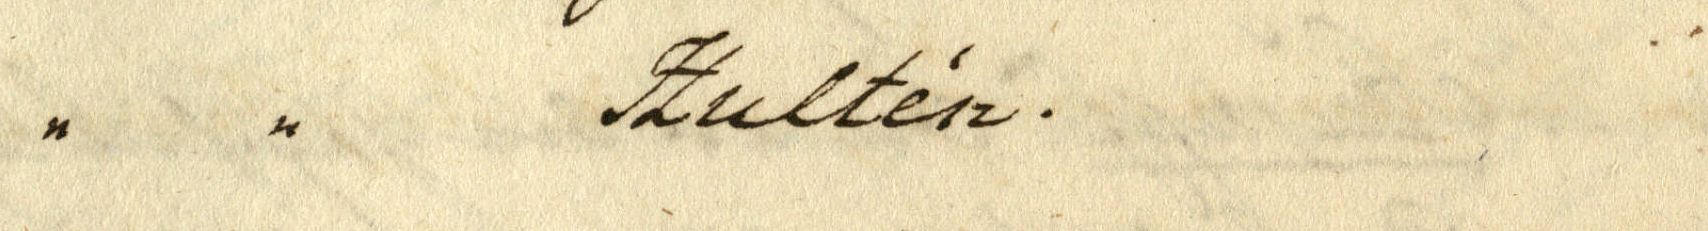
" " Hultén.
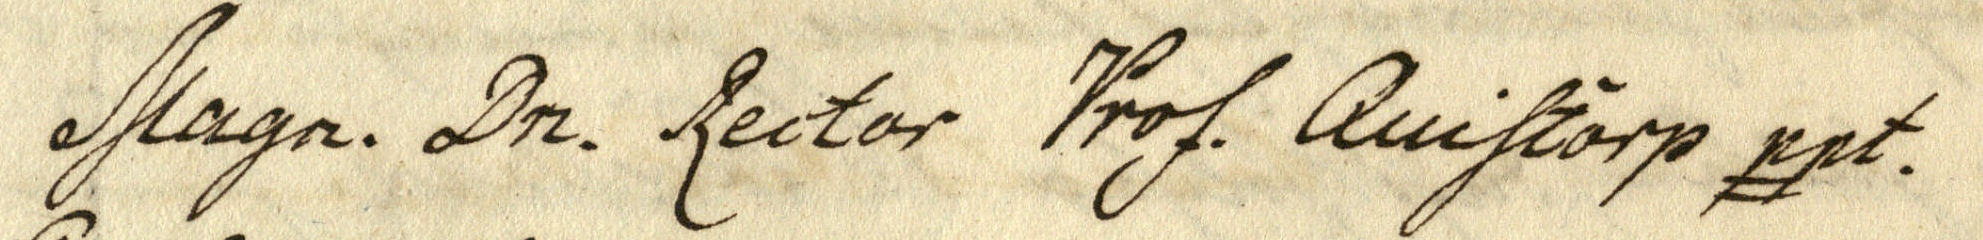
Magn. Dn. Rector Prof. Quistorp ppt.
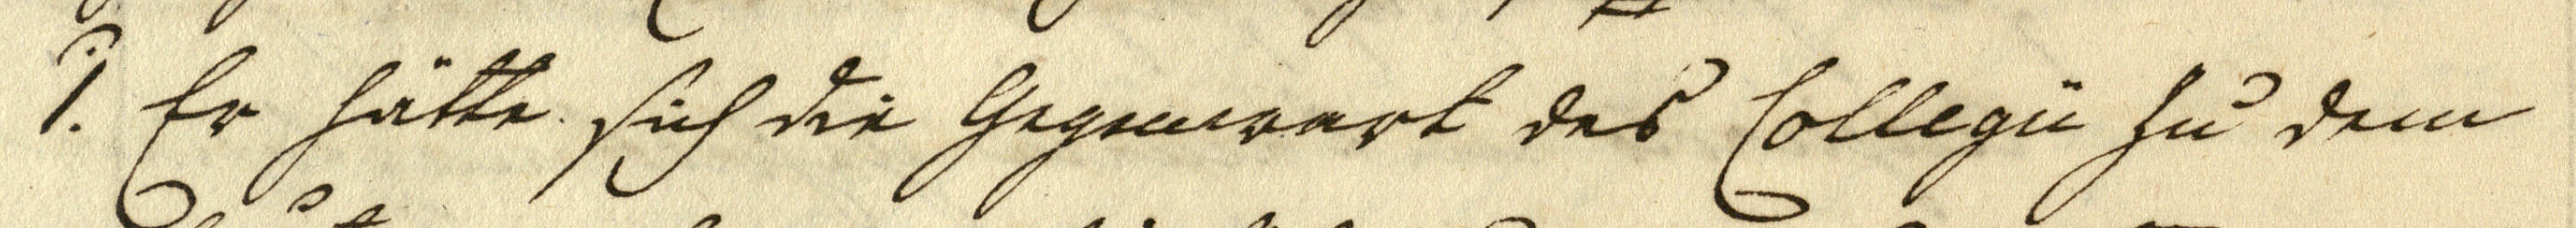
1. Er hätte sich die Gegenwart des Collegiii zu dem
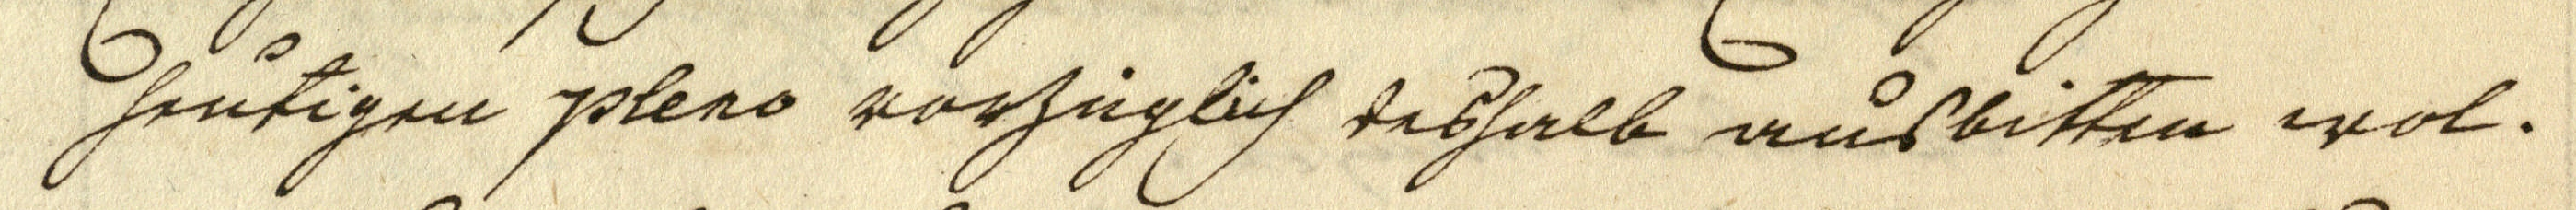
heutigen pleno vorzüglich deshalb ausbitten wol-
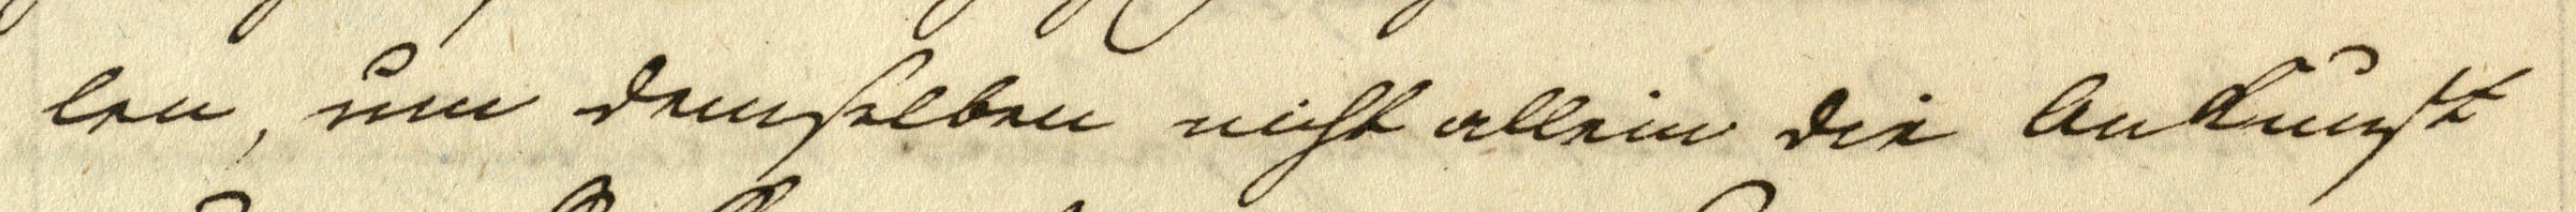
len, um demselben nicht allein die Ankunft
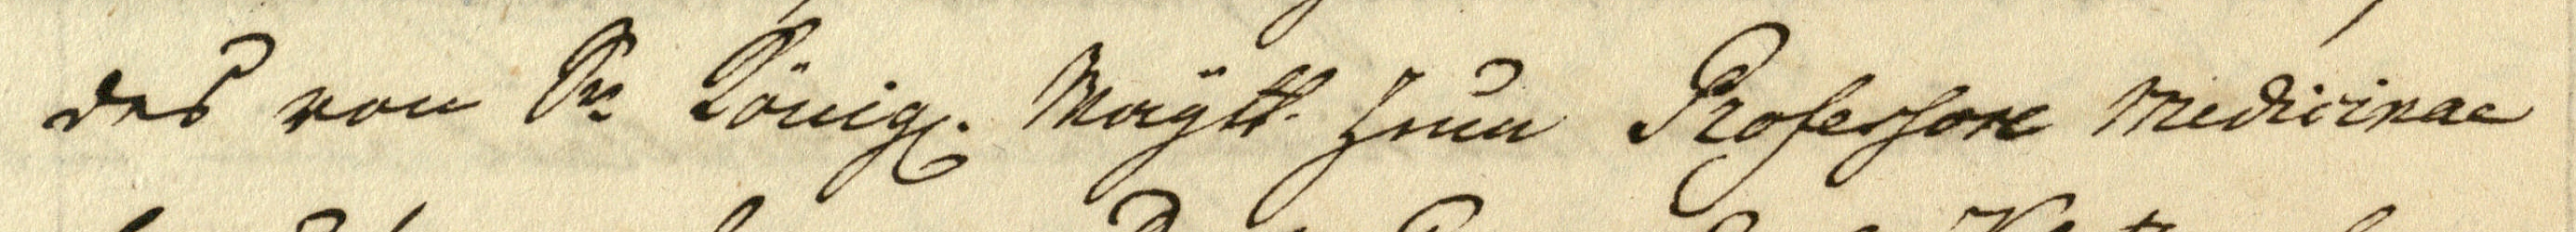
des von Sr. Königl. Maytt. zum Professore Medicinae
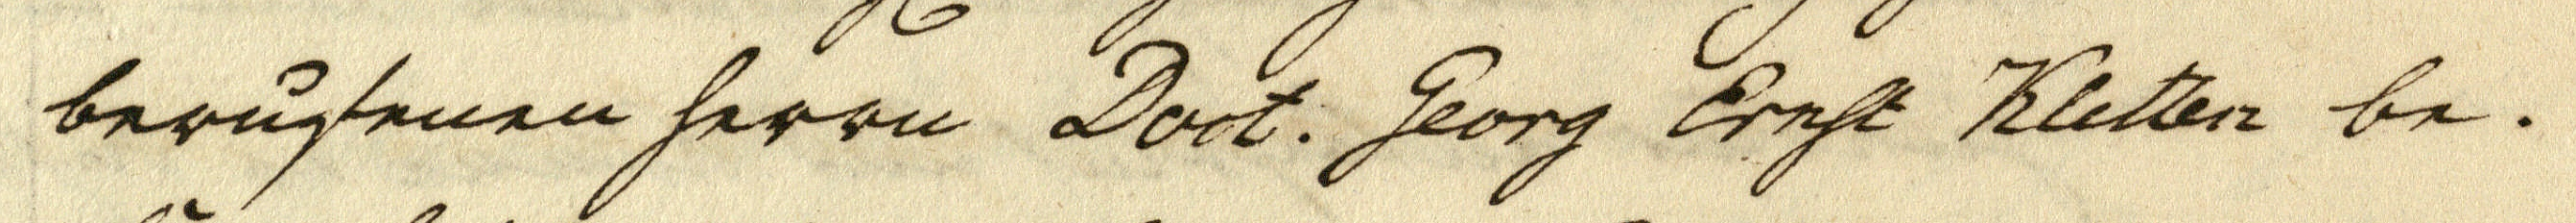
berufenen herrn Doct. Georg Ernst Kletten be-
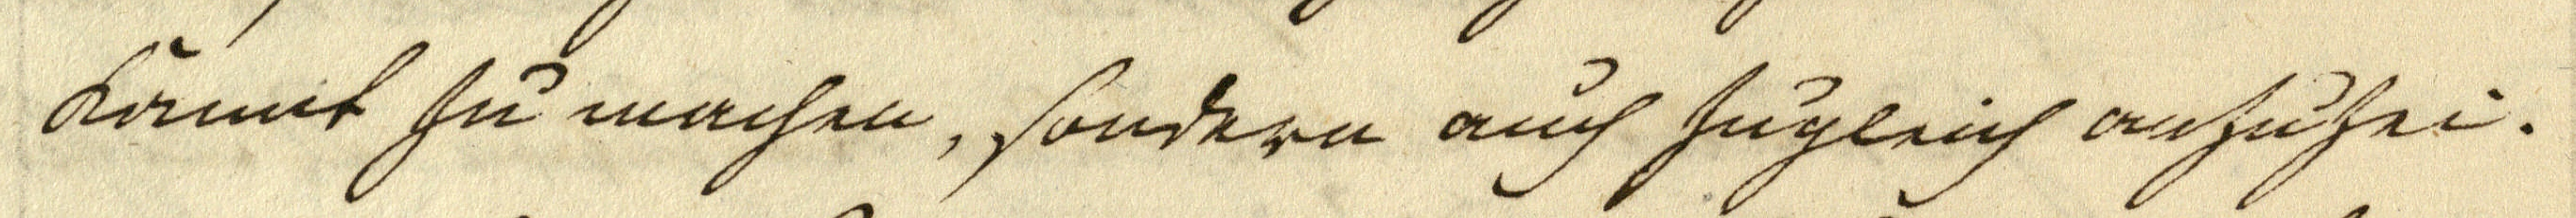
kannt zu machen, sondern auch zugleich anzuzei-
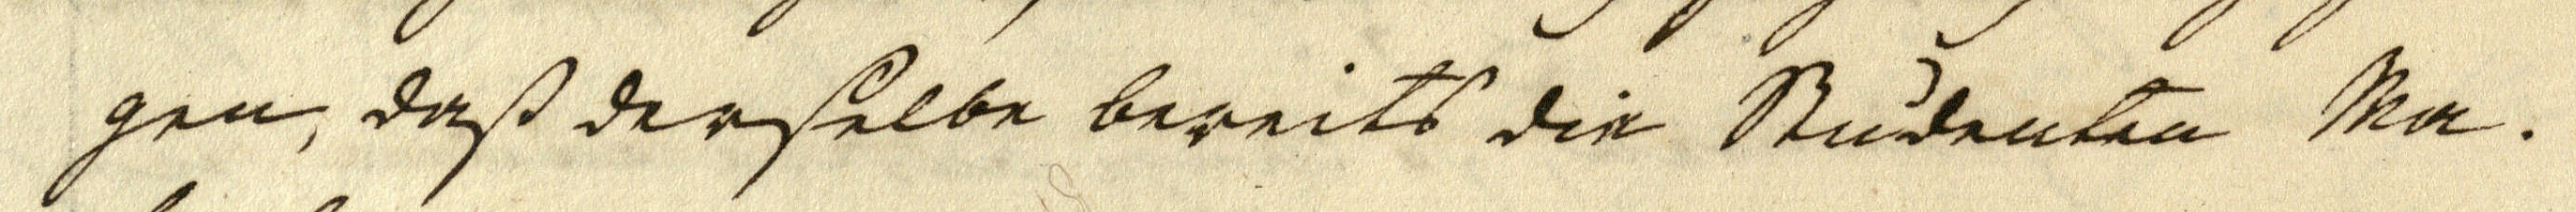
gen, daß derselbe bereits die Studenten Ma-
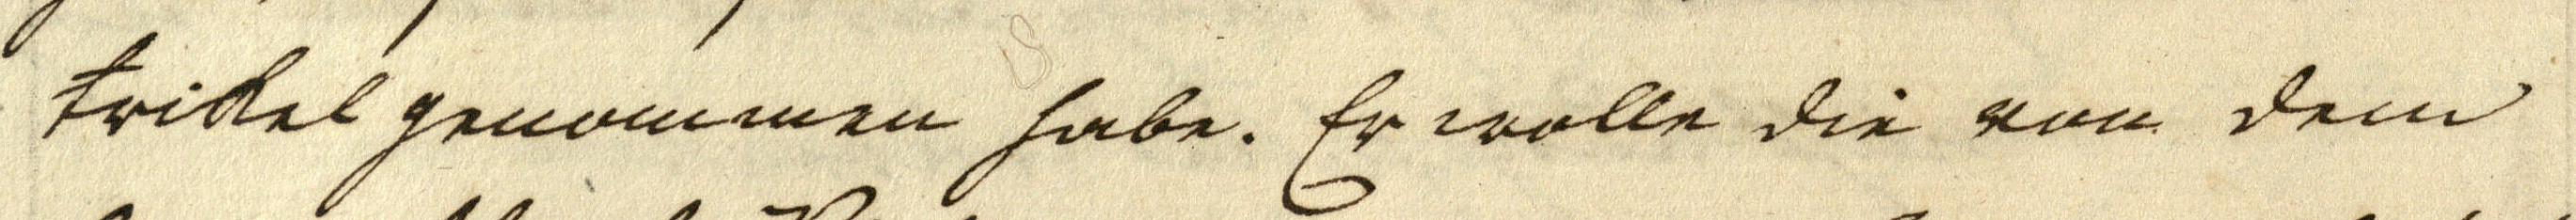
trikel genommen habe. Er wolle die von dem
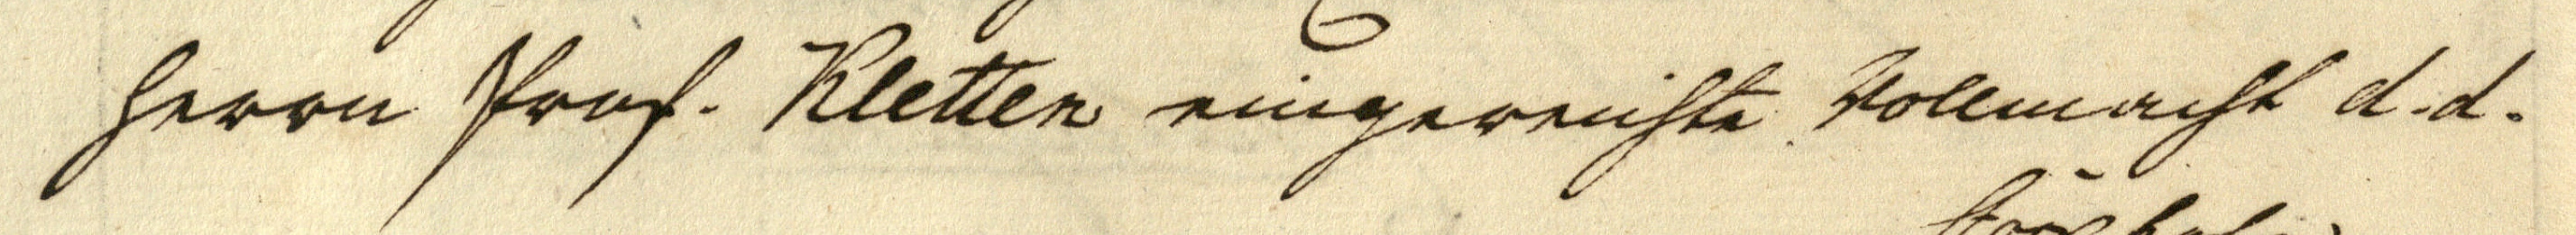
herrn Prof. Kletten eingereichte Vollmacht d.d.
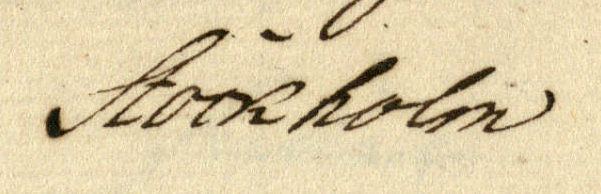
Stockholm
